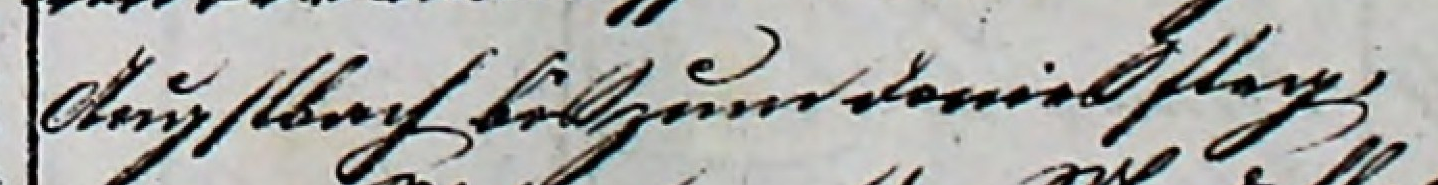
Augstbach bis zum dowirsfleg,
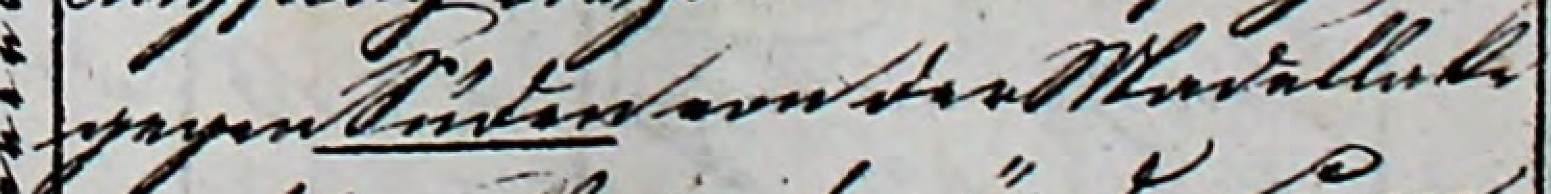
gegen Süden von der Madellake
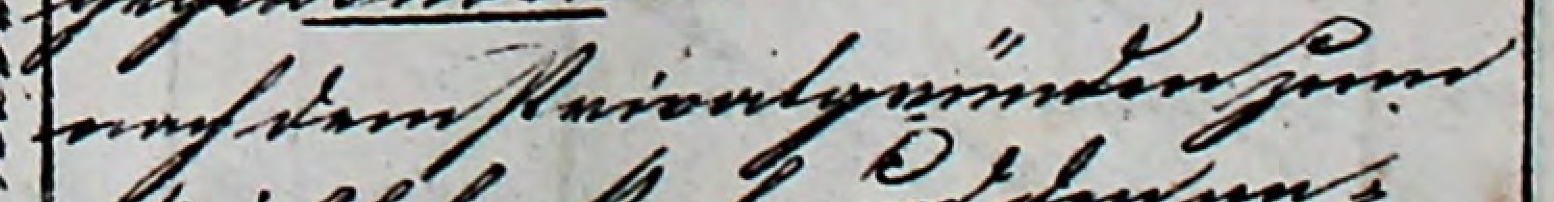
nach dem Privatgründen zum
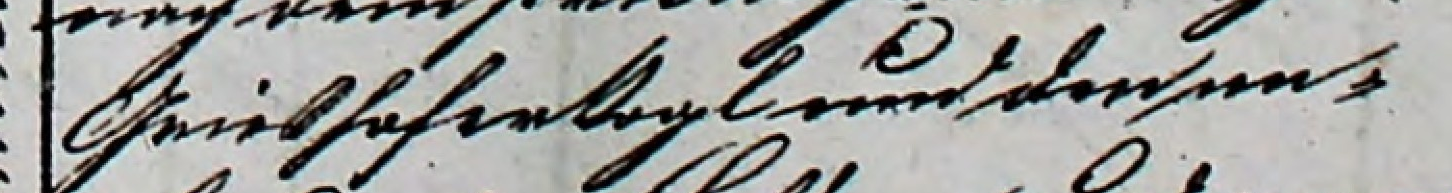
Grieshoferkogl und den an„
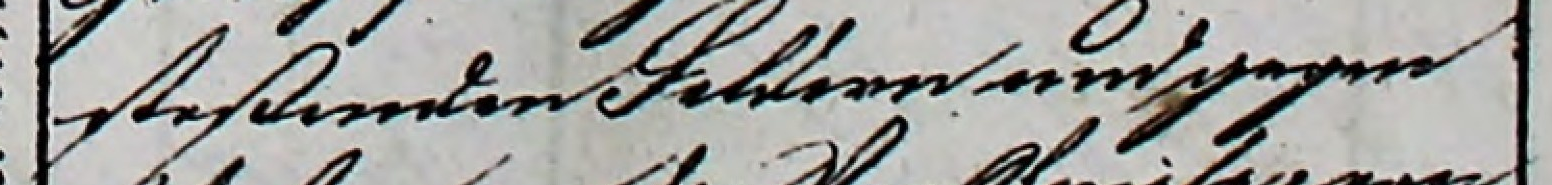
steßenden Feldern und gegen
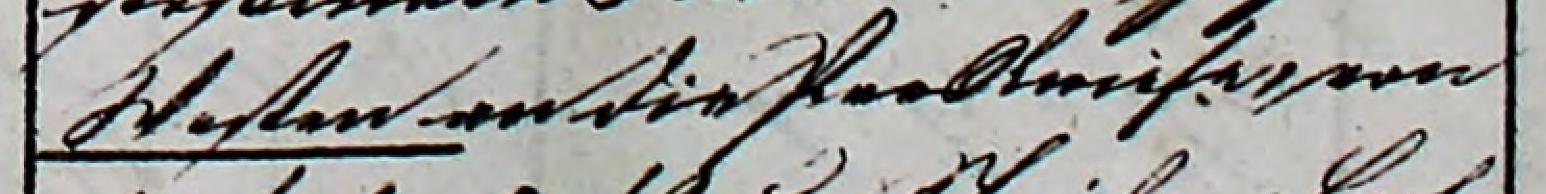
Westen an die Preslwiese, von
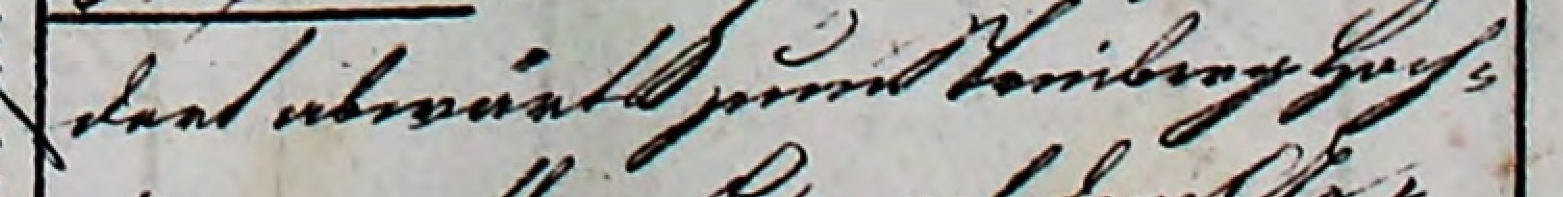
dert abwärts zum Teinberg Hoch„
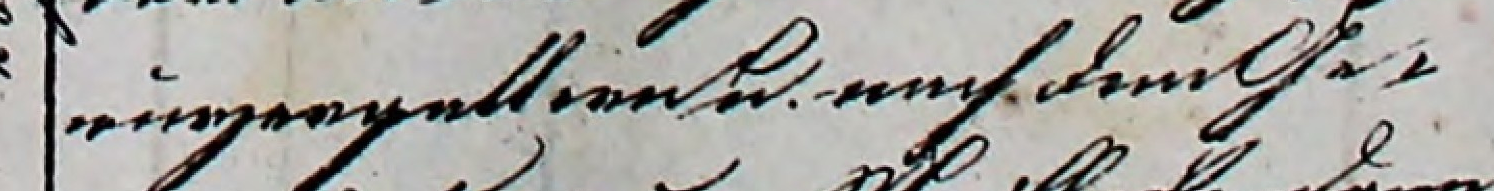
wurzergattern u. nach dem Ge„
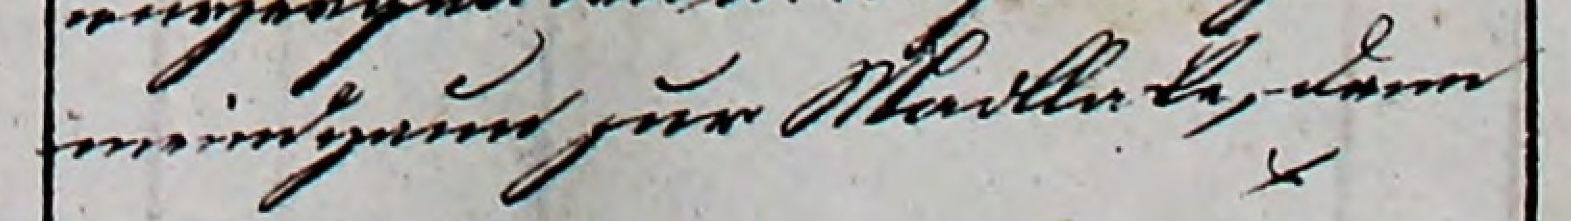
meindezaun zur Madllake, dann ./.
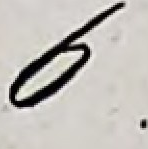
6
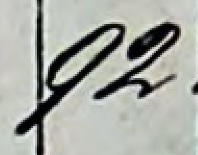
92
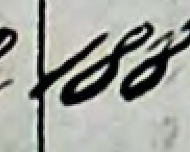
188
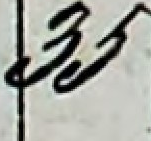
35
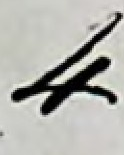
4
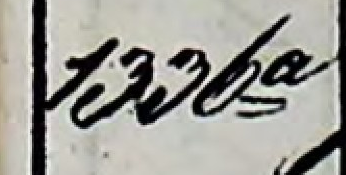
1336a
